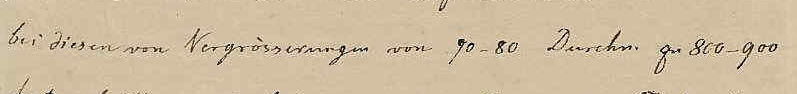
bei diesen von Vergrösserungen von 70–80 Durchm. zu 800–900
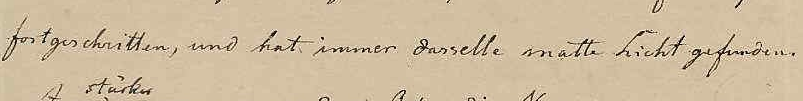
fortgeschritten, und hat immer dasselbe matte Licht gefunden.
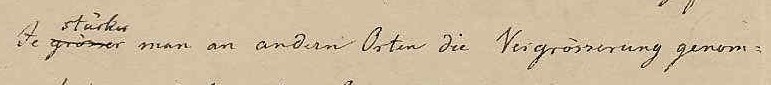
Je grösserstärker man an andern Orten die Vergrösserung genom-
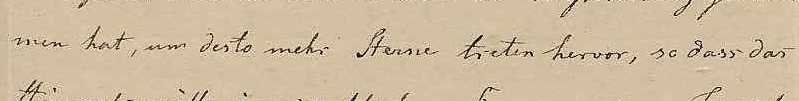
men hat, um desto mehr Sterne treten hervor, so dass das
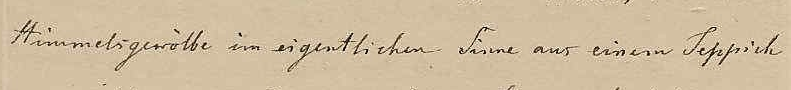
Himmelsgewölbe im eigentlichen Sinne aus einem Teppich
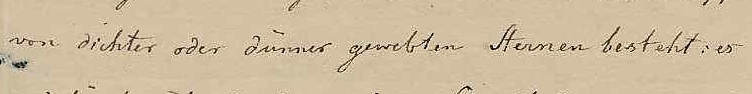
von dichter oder dünner gewebten Sternen besteht: es
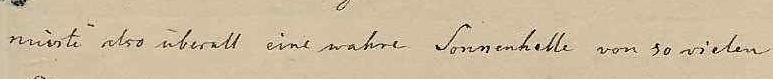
müste also überall eine wahre Sonnenhelle von so vielen
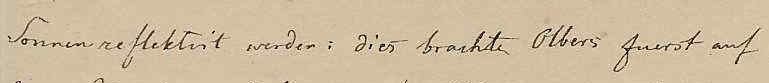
Sonnen reflektirt werden: dies brachte Olbers zuerst auf
